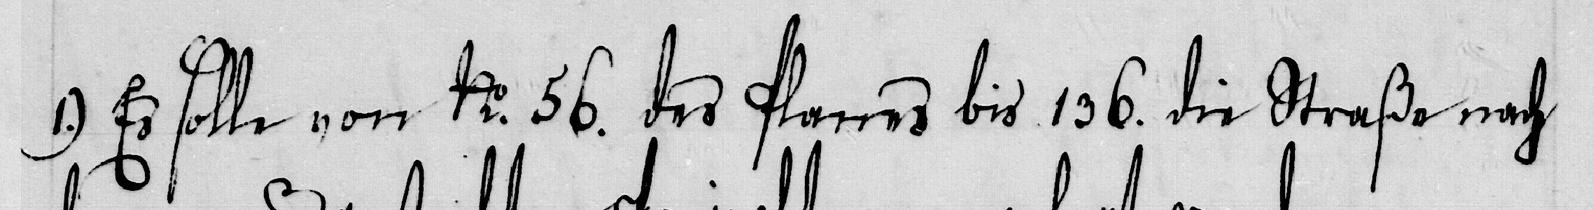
1.) Es solle von No. 56. des Planes bis 136. die Straße nach
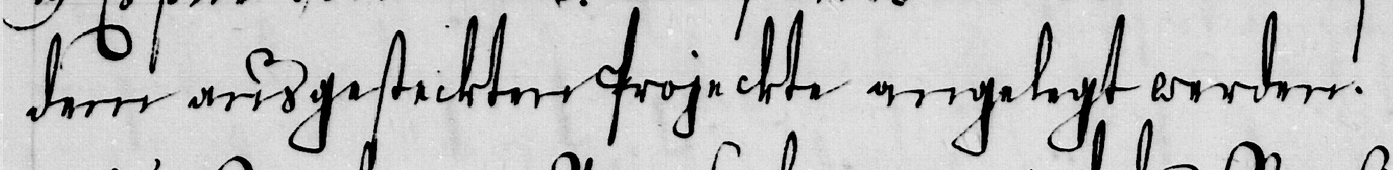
dem ausgesteckten Projeckte angelegt werden.
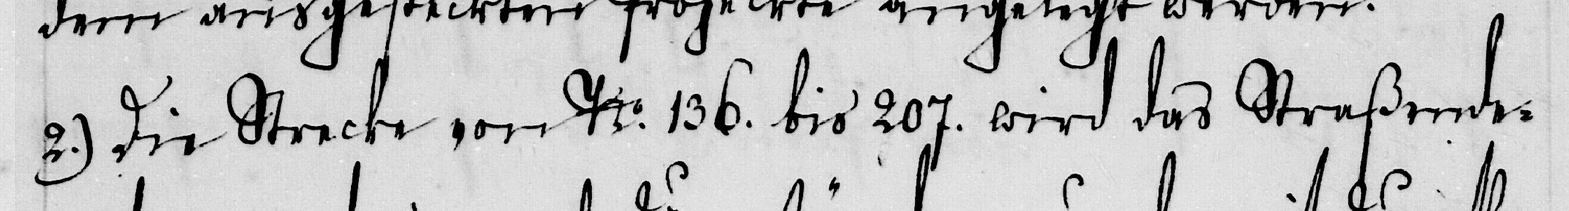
2.) Die Strecke von No. 136 bis 207. wird das Straßende¬
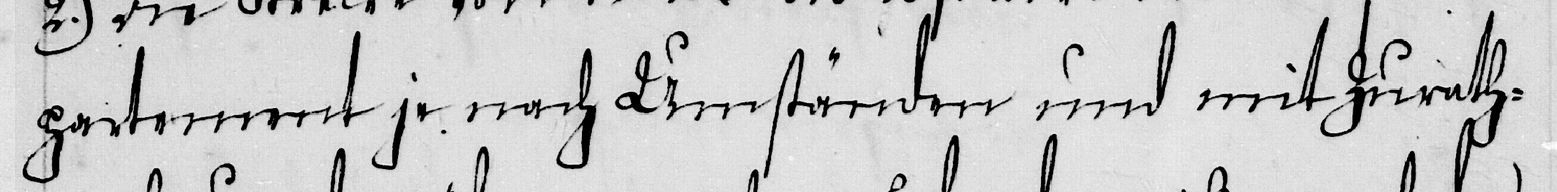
partement je nach Umständen und mit Zurath¬
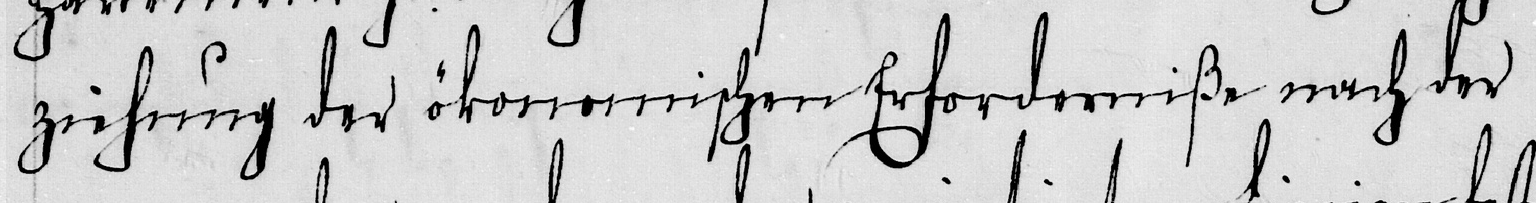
ziehung der ökonomischen Erforderniße nach der
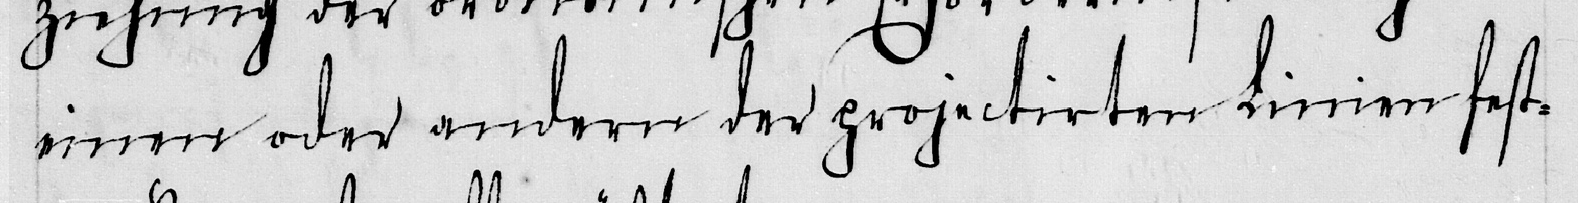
einen oder andern der projectirten Linien fest¬
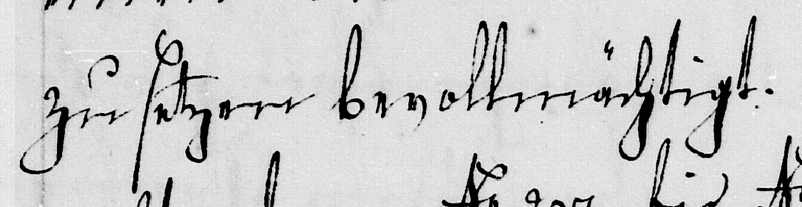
zusetzen bevollmächtigt.
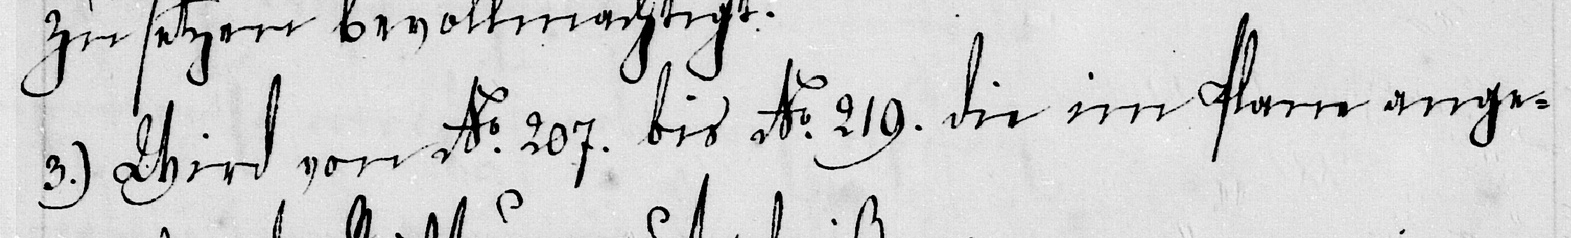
3.) Wird von No. 207. bis No. 219. die im Plane ange¬
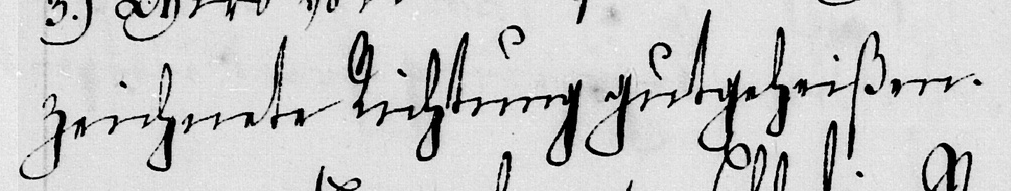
zeichnete Richtung gutgeheißen.
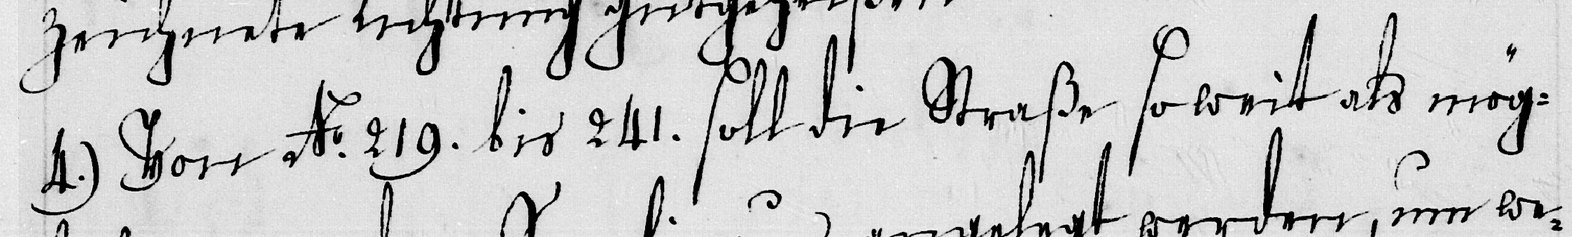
4.) Vom No. 219. bis 241. soll die Straße so weit als mög¬
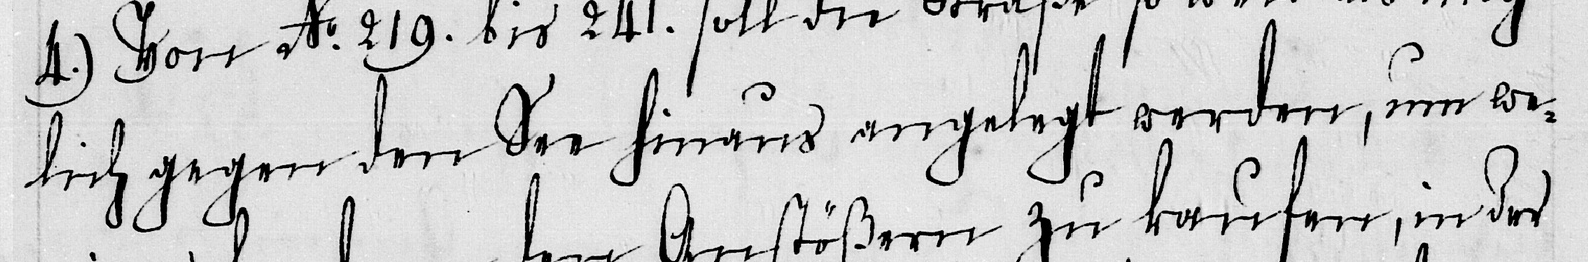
lich gegen den See hinaus angelegt werden, um we¬
